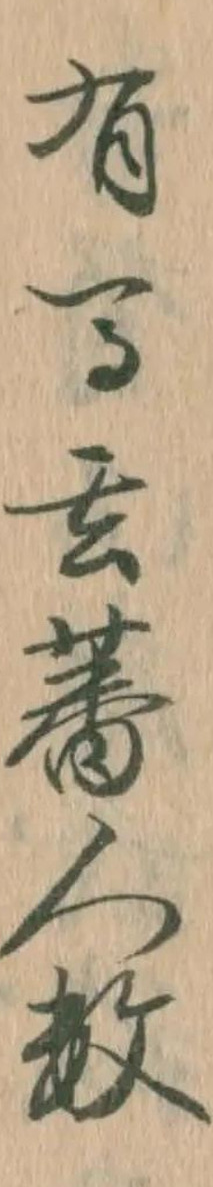有馬玄蕃人数
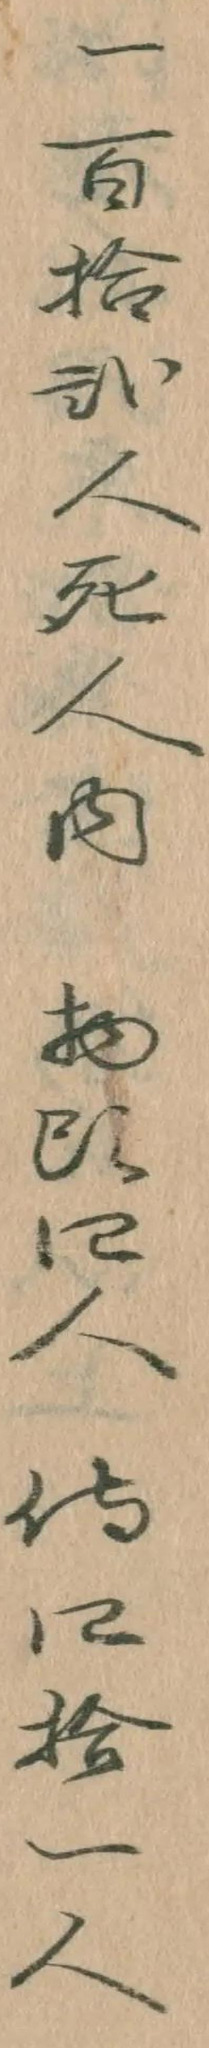一百拾弐人死人内物頭四人侍四拾一人
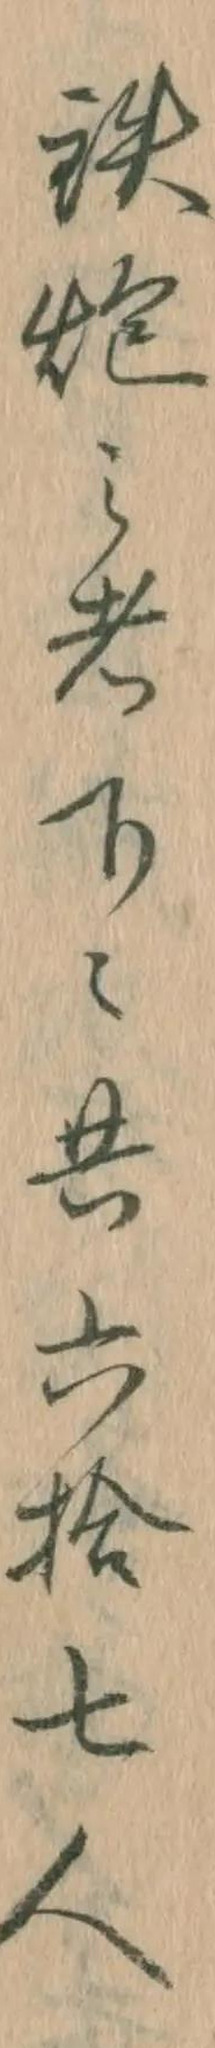鉄炮之者下々共六拾七人
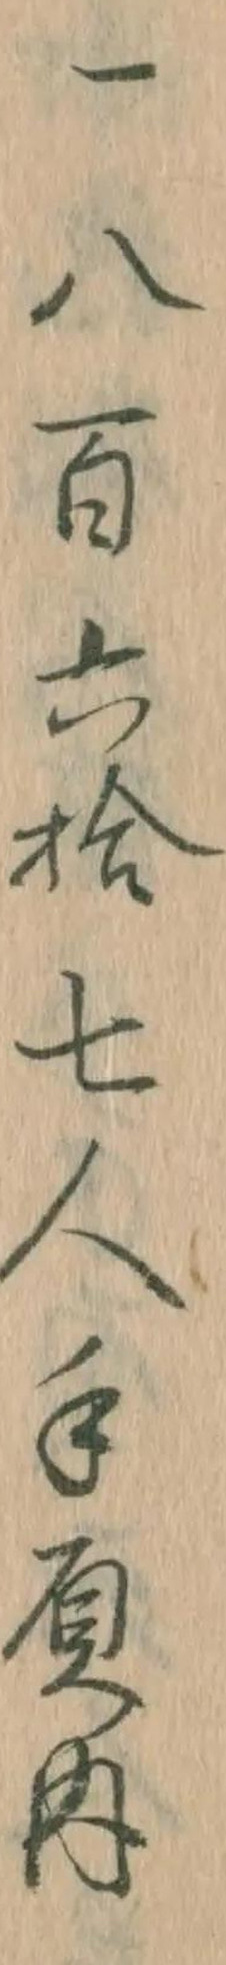一八百六拾七人手負内
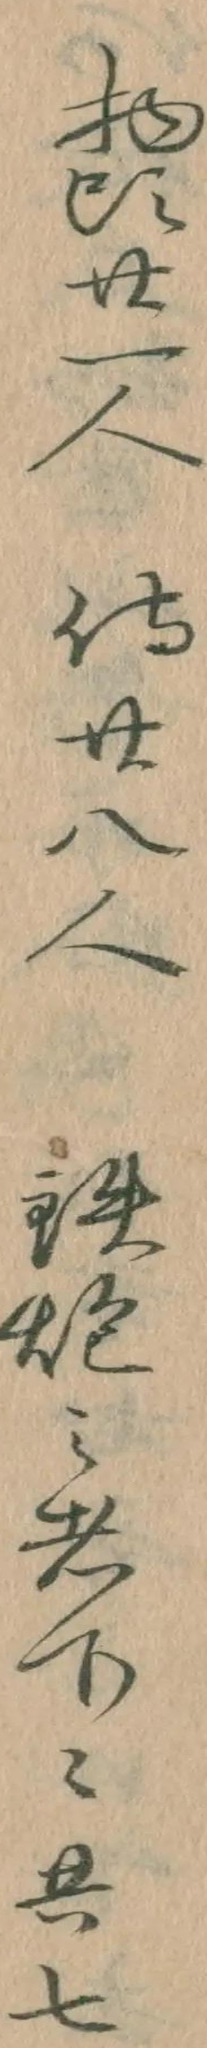物頭廿一人侍廿八人鉄炮之者下々共七
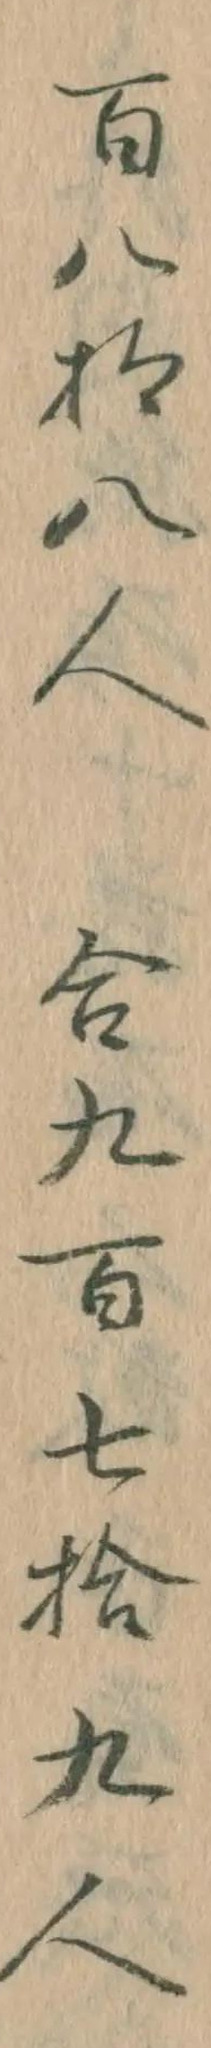百八拾八人合九百七拾九人
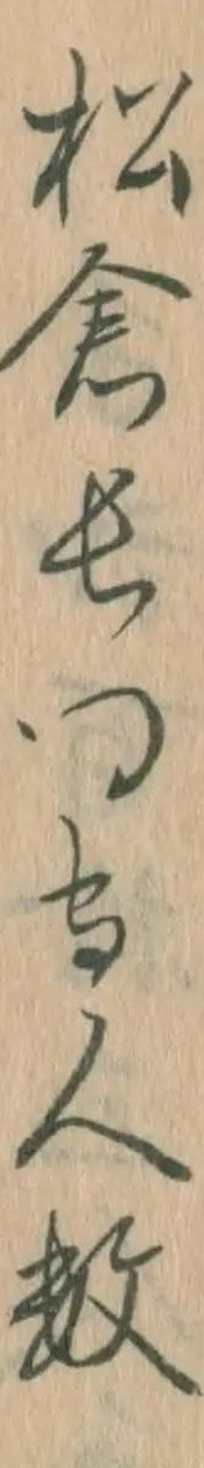松倉長門守人数
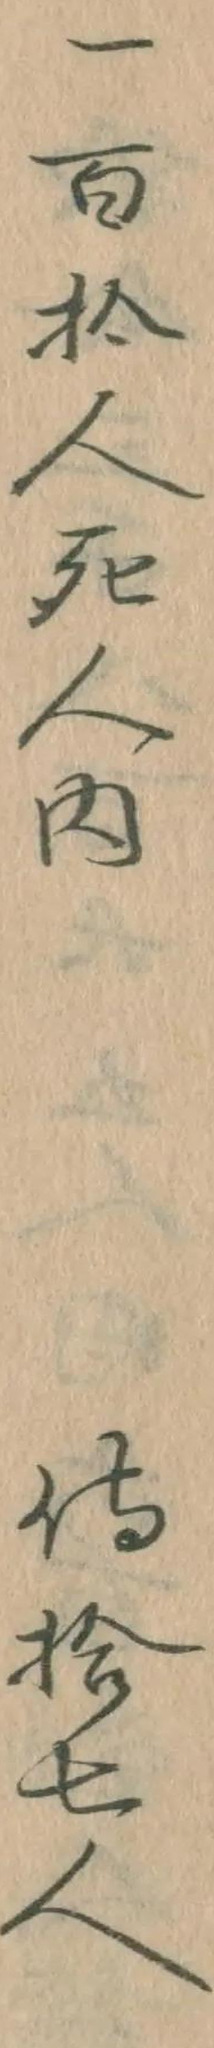一百拾人死人内侍拾七人
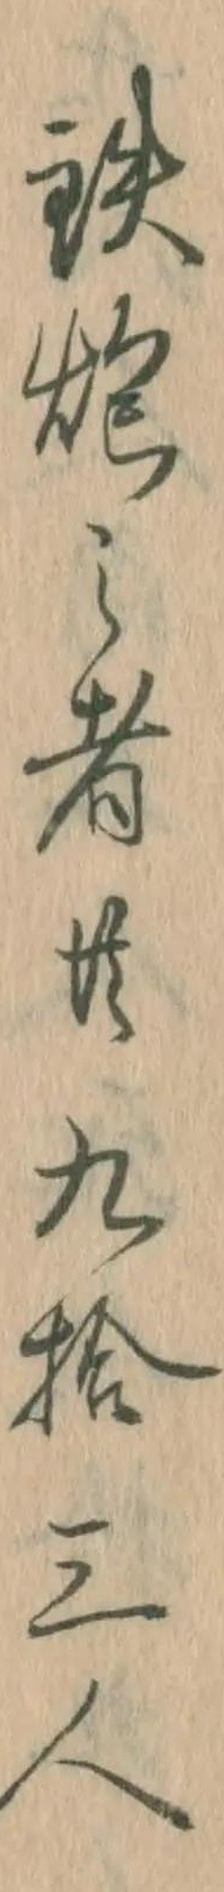鉄炮之者共九拾三人
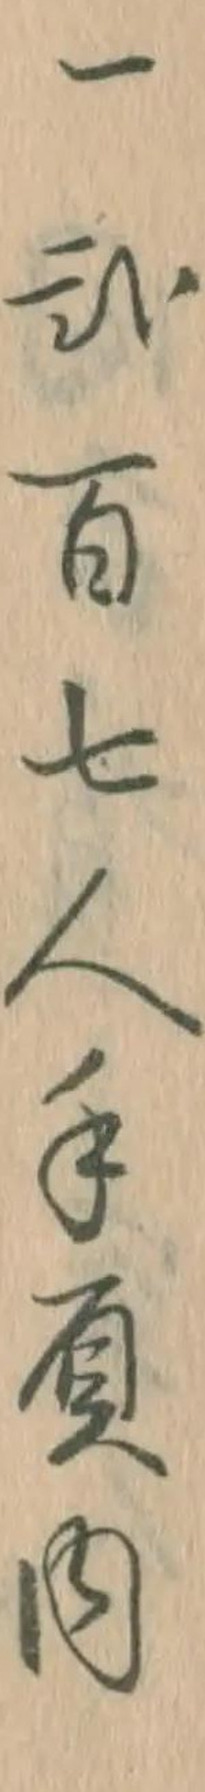一弐千百廿人手負内
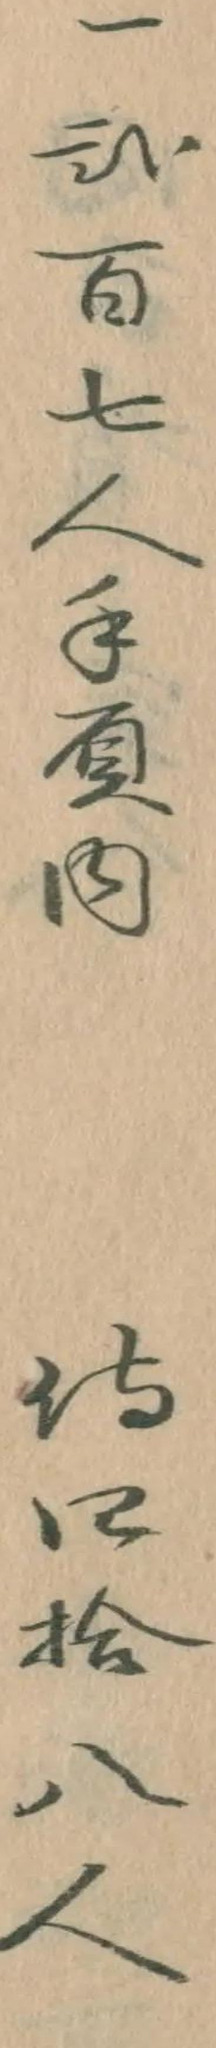一弐百七人手負内侍四拾八人
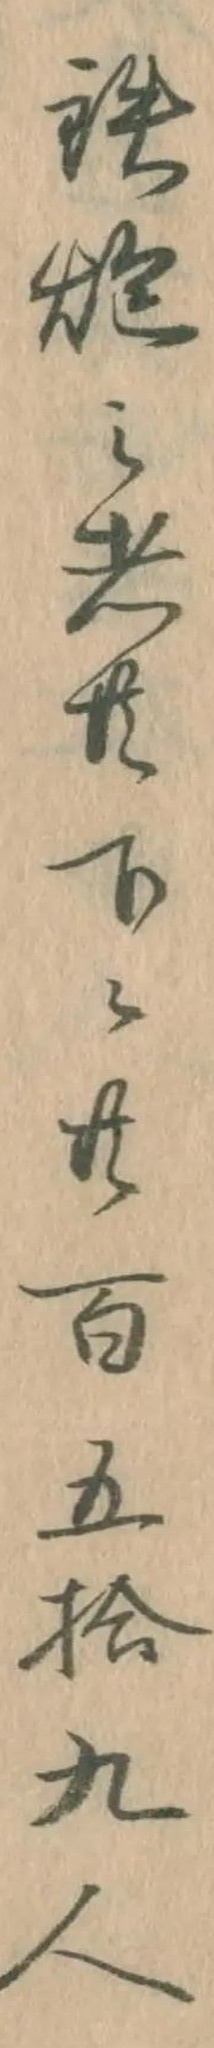鉄炮之者共下々共百五拾九人

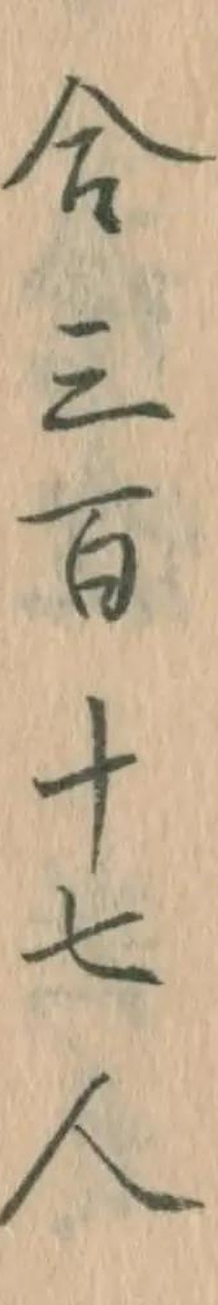合三百十七人
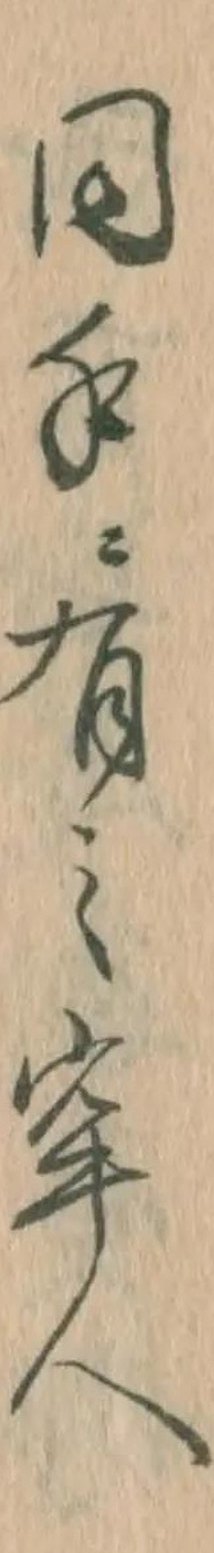同手に有之牢人
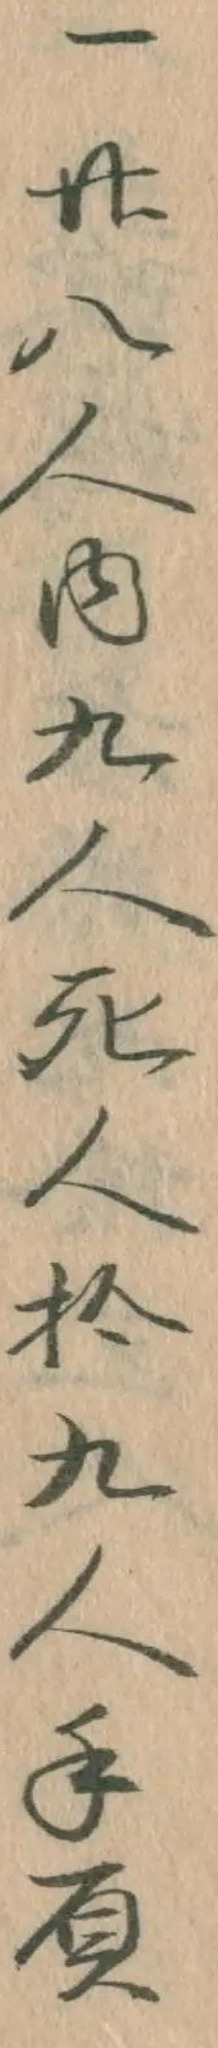一廿八人内九人死人拾九人手負
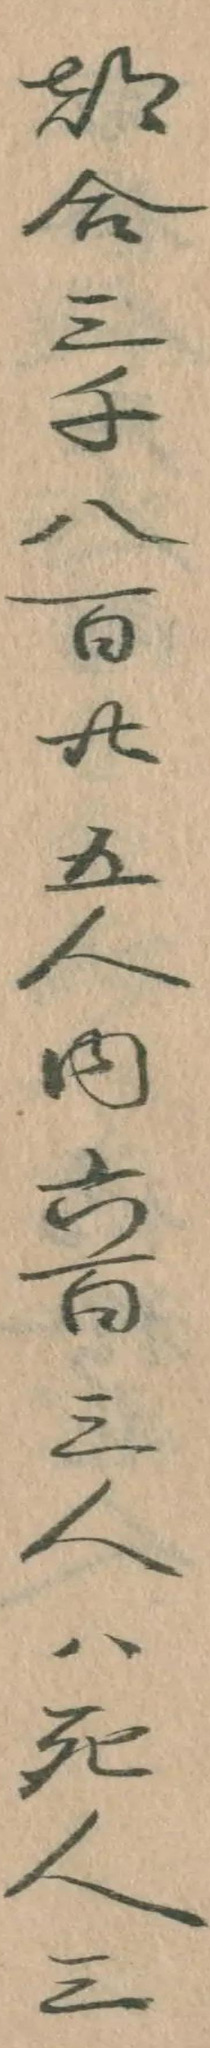都合三千八百廿五人内六百三人は死人三
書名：切支丹御退治記 49巻. [5]
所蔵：国立国会図書館 National Diet Library, JAPAN
